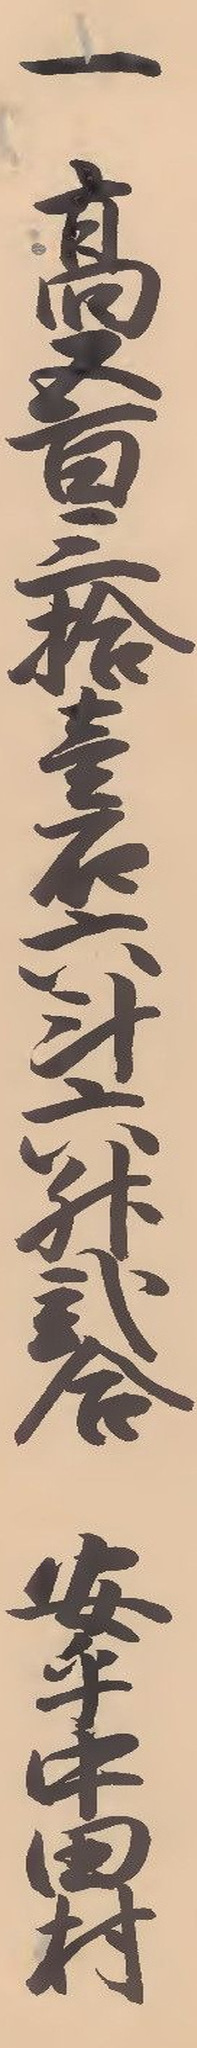一高五百三拾壱石六斗六升弐合安乎中田村
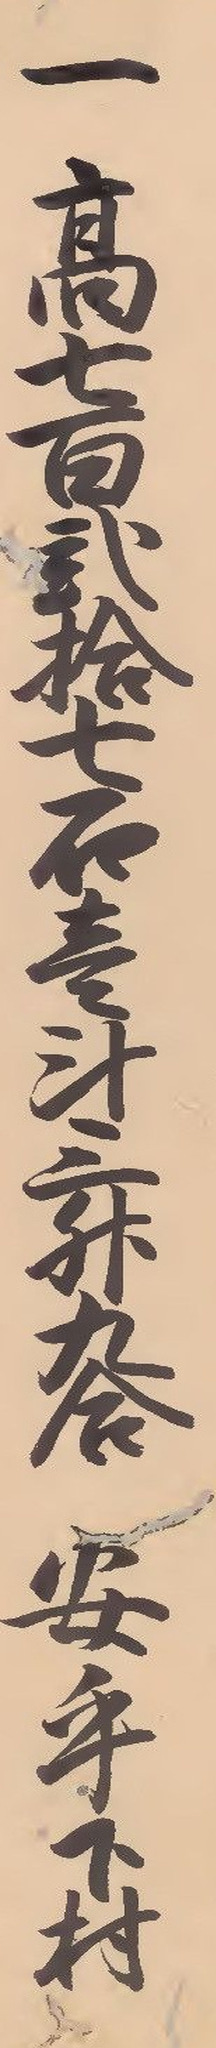一高七百弐拾七石壱斗三升九合安乎下村

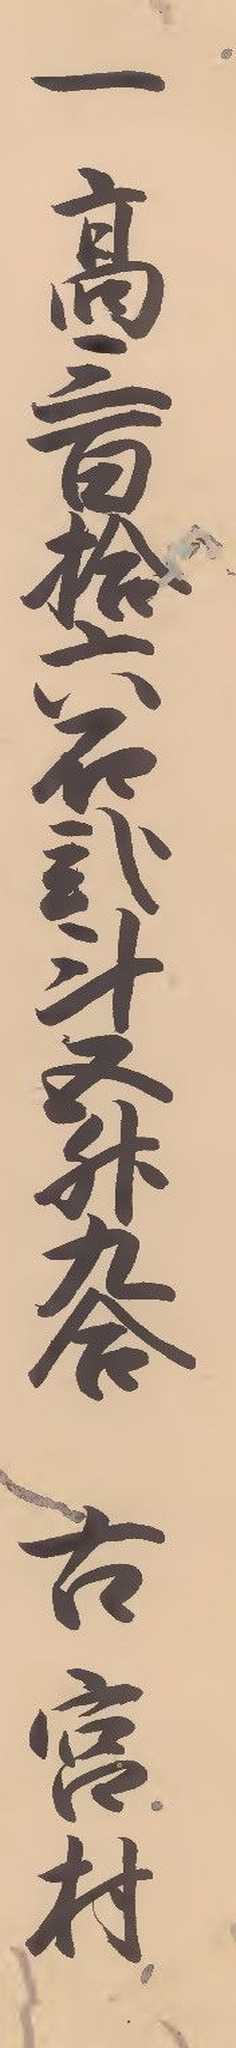一高三百拾六石弐斗五升九合古宮村
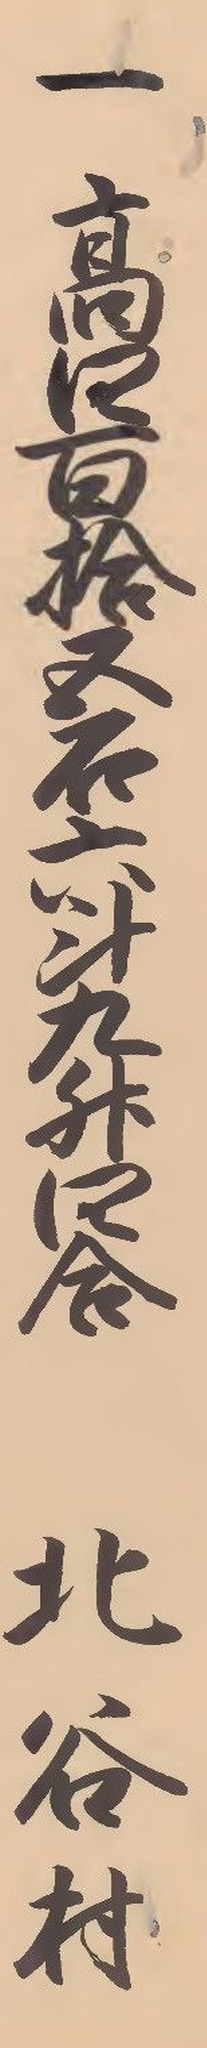一高四百拾五石六斗九升四合北谷村
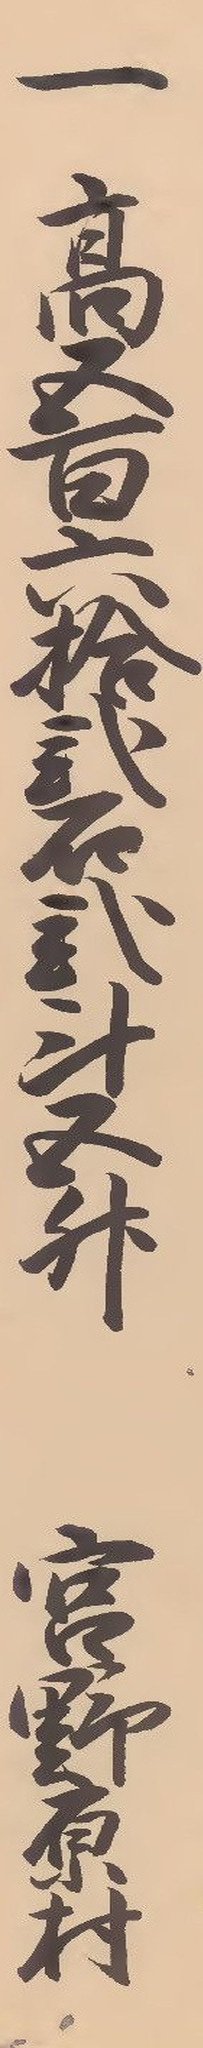一高五百六拾弐石弐斗五升宮野原村
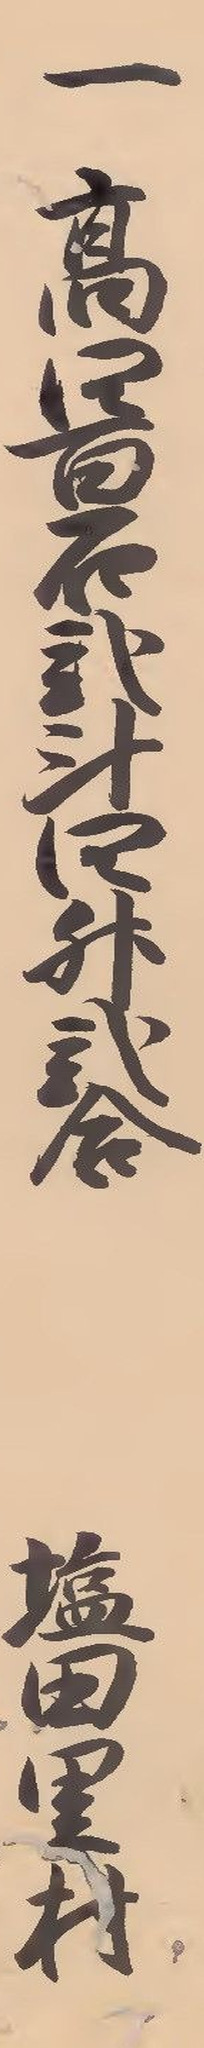一高四百石弐斗四升弐合塩田里村
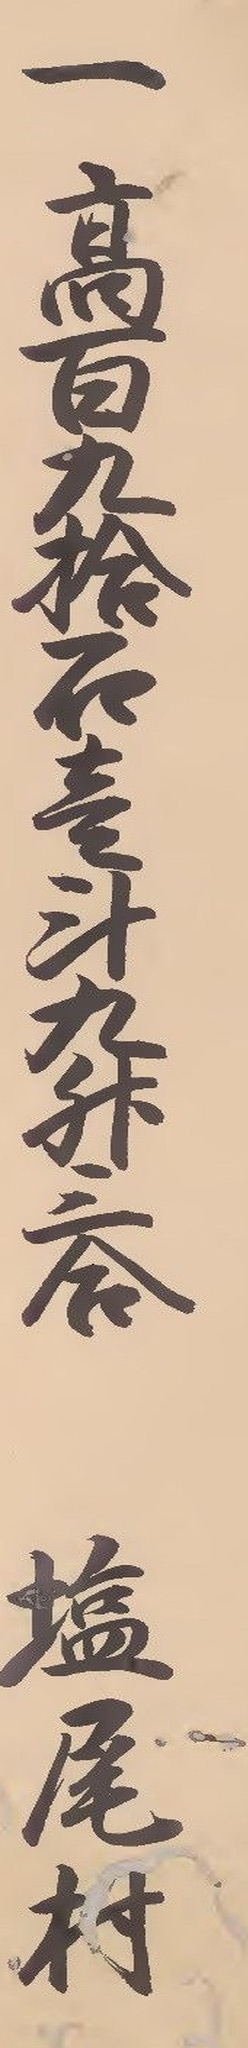一高百九拾石壱斗九升三合塩尾村
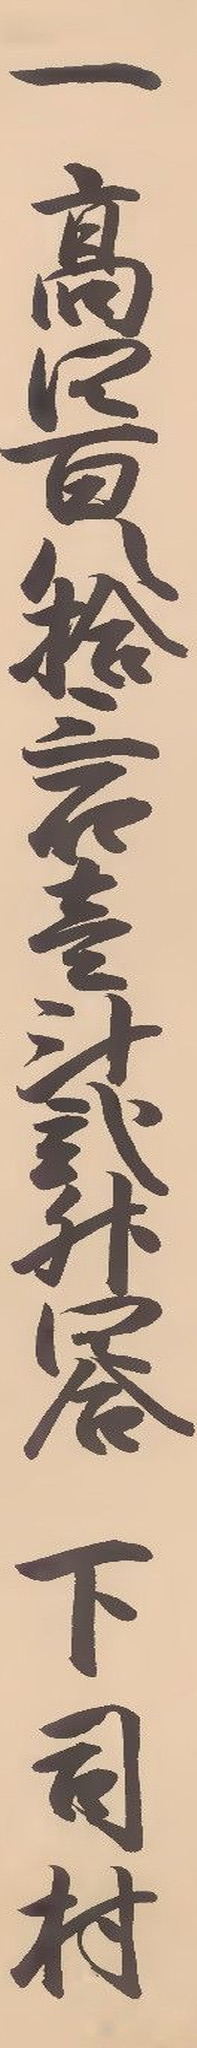一高四百八拾三石壱斗弐升四合下司村
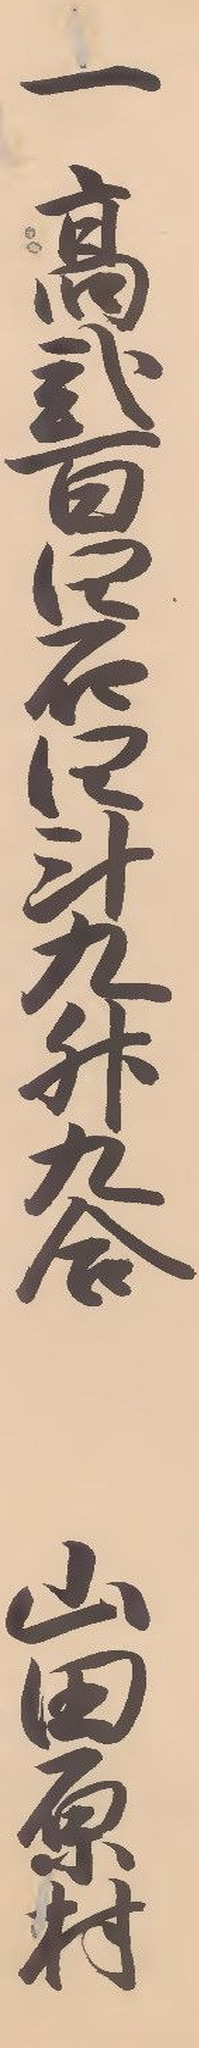一高弐百四石四斗九升九合山田原村
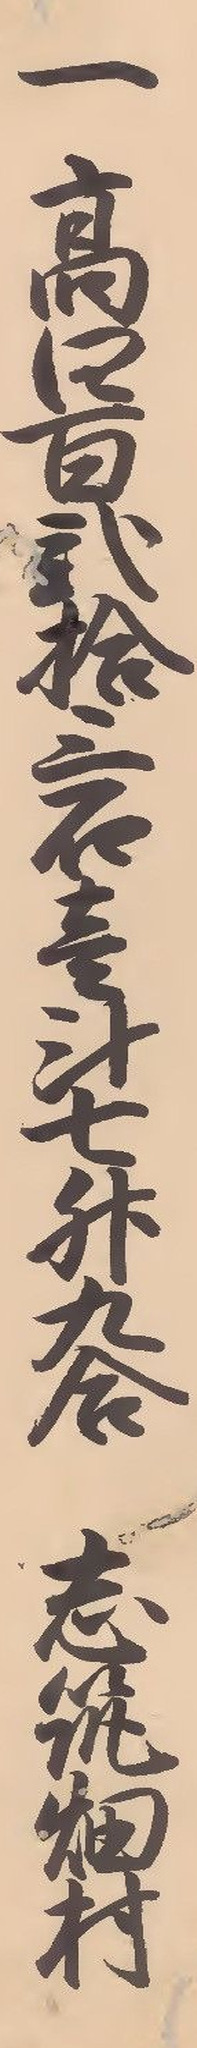一高四百弐拾三石壱斗七升九合志筑畑村

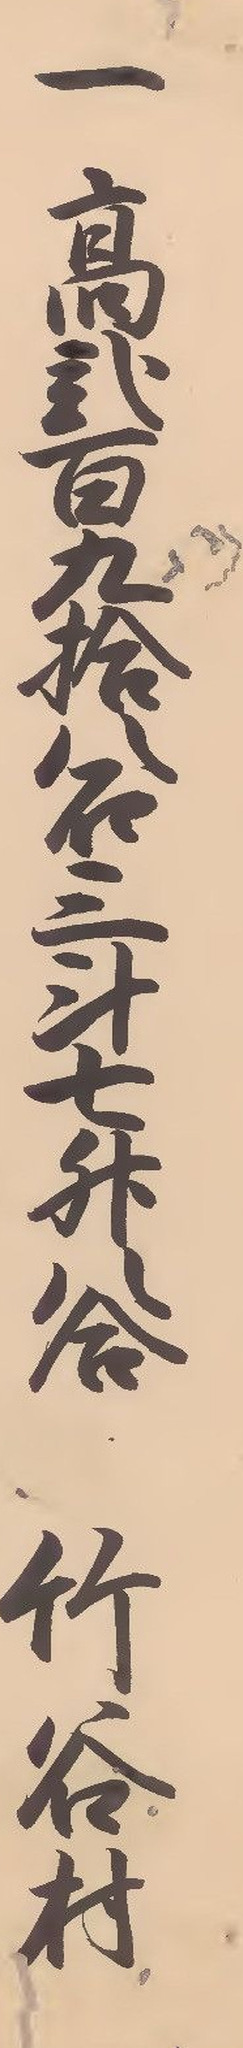一高弐百九拾八石三斗七升八合竹谷村
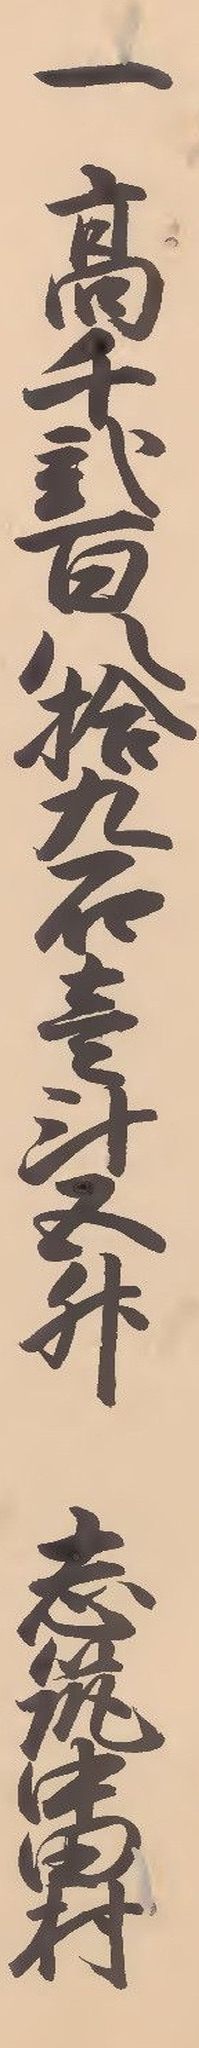一高千弐百八拾九石壱斗五升志筑中田村
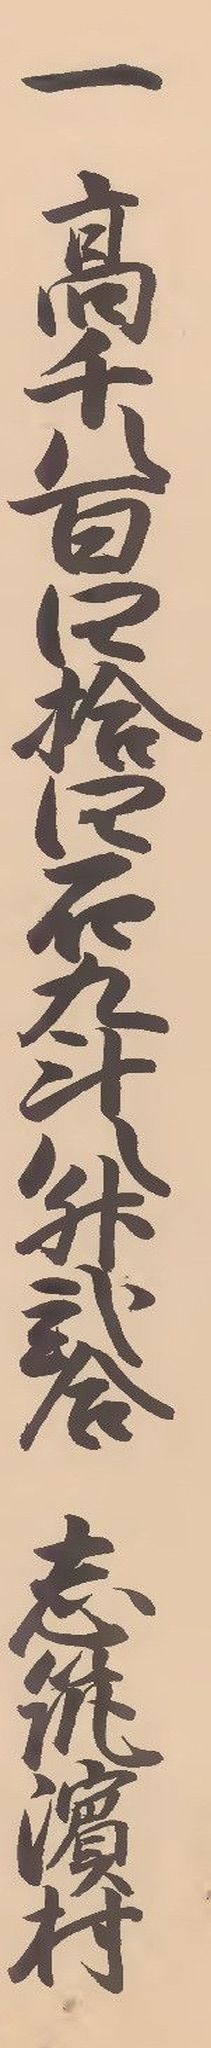一高千八百四拾四石九斗八升弐合志筑浜村
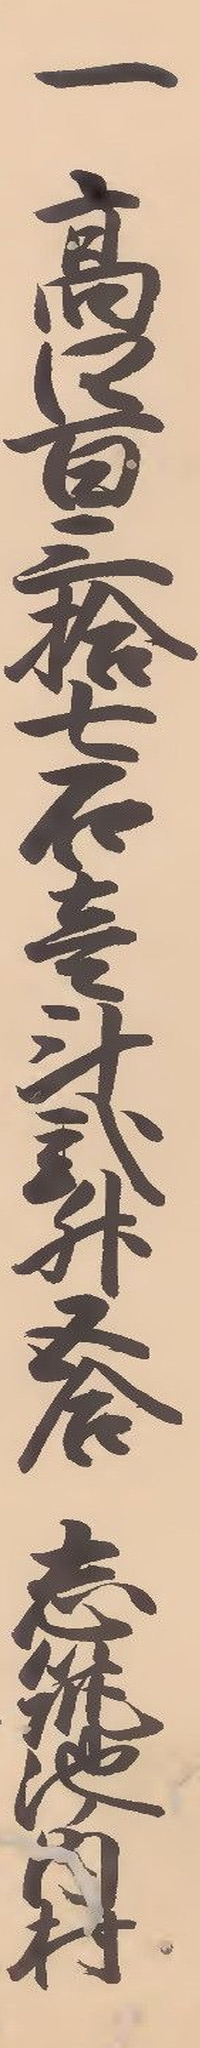一高四百三拾七石壱斗弐升五合志筑池ノ内村
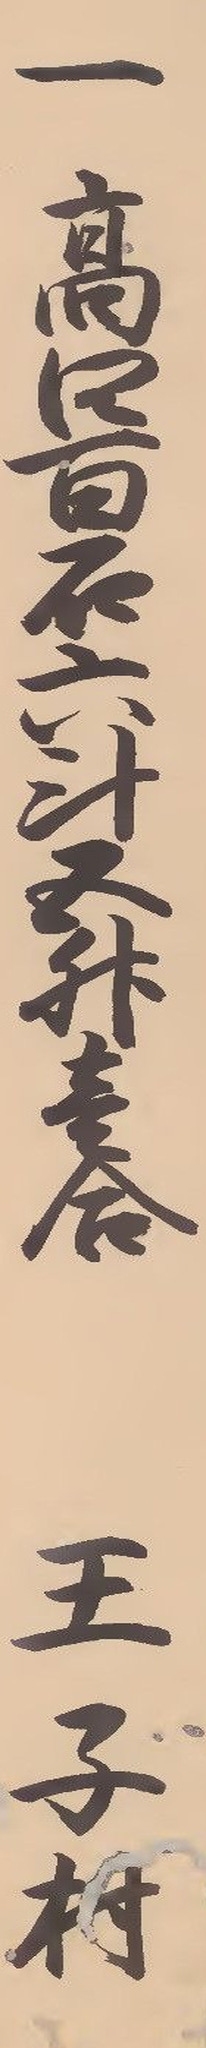一高四百石六斗五升壱合王子村
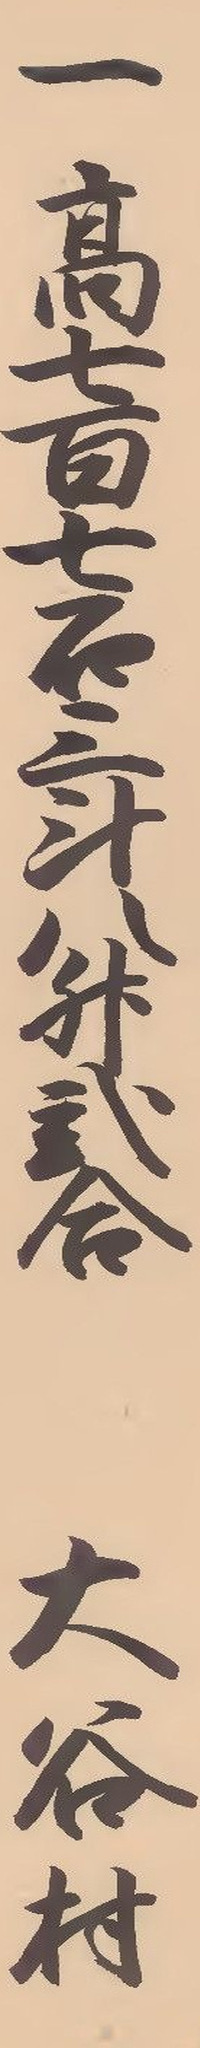一高七百七石三斗八升弐合大谷村
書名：淡路国郷帳
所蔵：国立公文書館 National Archives of Japan
